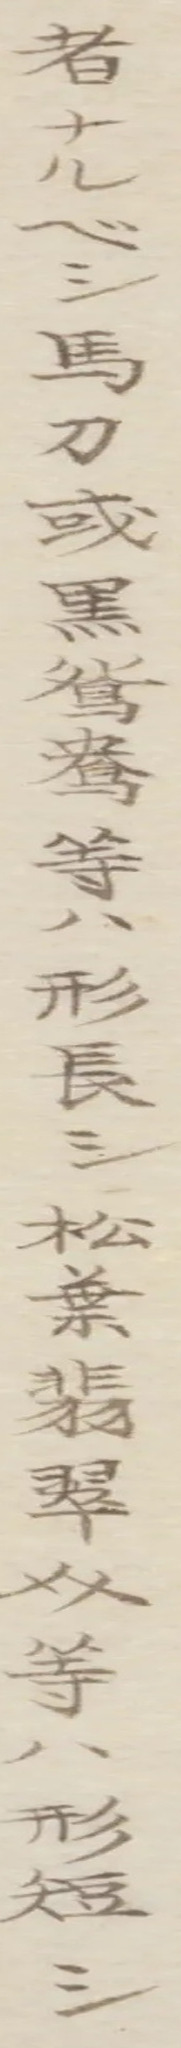者ナルベシ馬刀或黒サギ鴛鴦等ハ形長シ松葉翡翠介等ハ形短シ
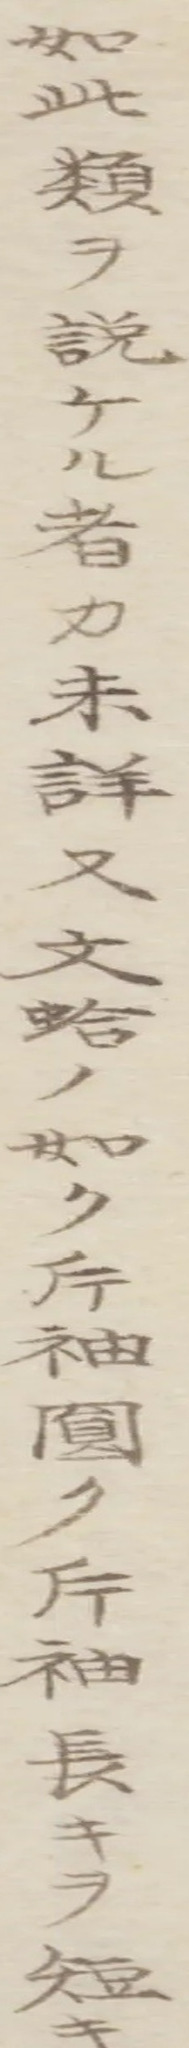如此類ヲ説ケル者カ未詳又文蛤ノ如ク斤袖圎ク斤袖長キヲ短キ
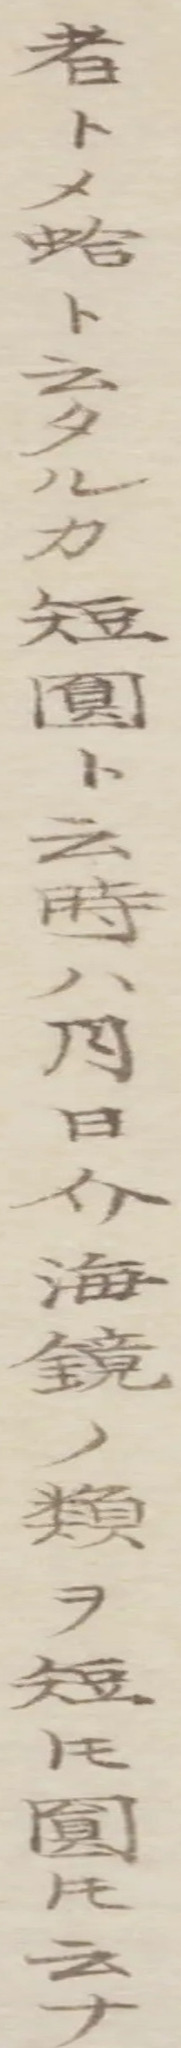者トシテ蛤トイフタルカ短圎トイフ時ハ月日介海鏡ノ類短ドモ圎ドモイフナ
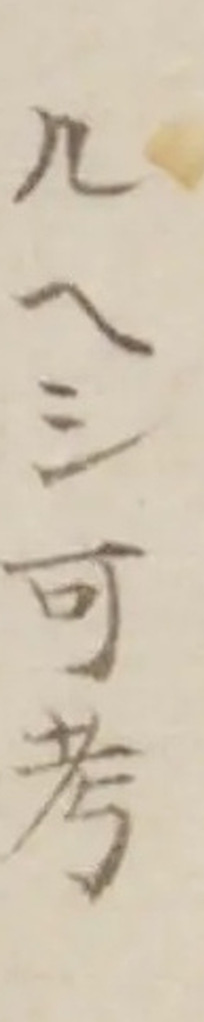ルベシ可考
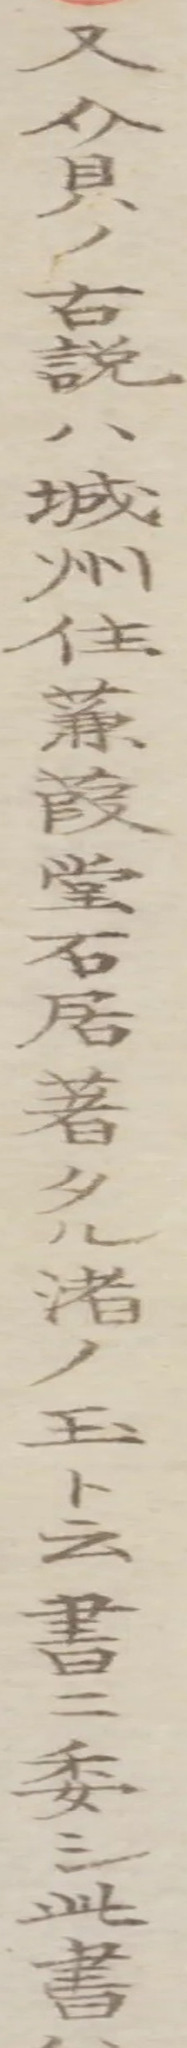○又介貝ノ古説ハ城州住蒹葭堂石居著タル渚ノ玉トイフ書ニ委シ此書ハ
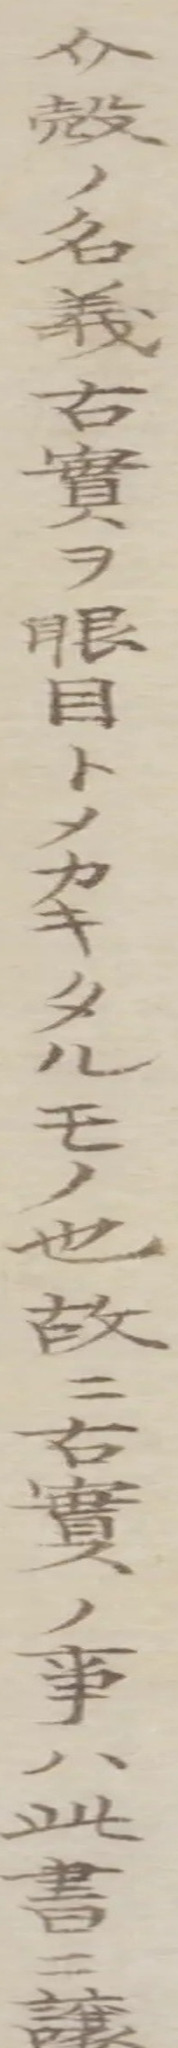介殻ノ名義古實ヲ眼目トシテカキタルモノ也故ニ右實ノ事ハ此書ニ譲

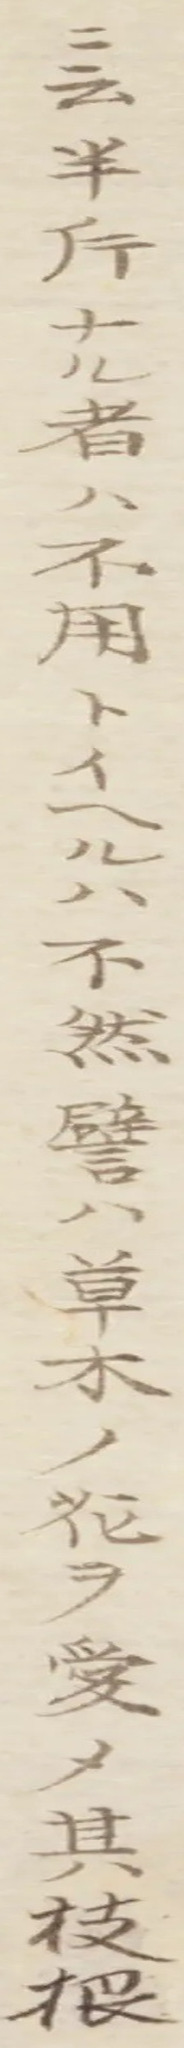ニイフ半斤ナル者ハ不用トイヘルハ不然譬ハ草木ノ花ヲ愛シテ其枝根
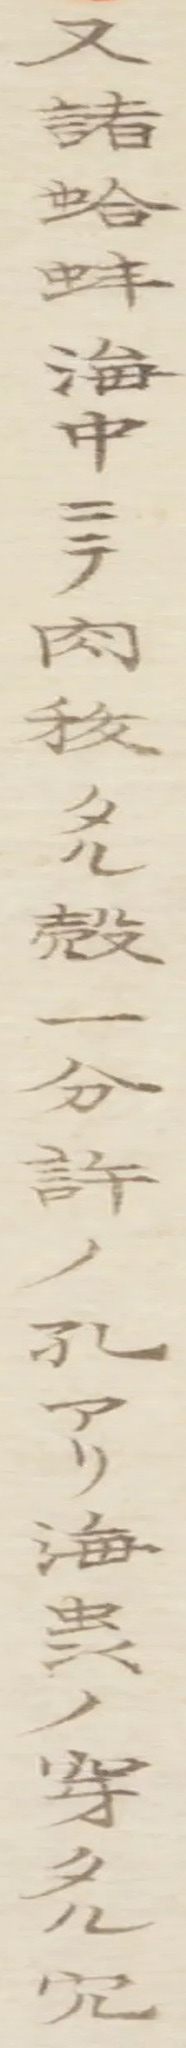○又諸蛤蚌海中ニテ肉移タル殻一分許ノコウ抗孔アリ海虫ノ穿タル冗
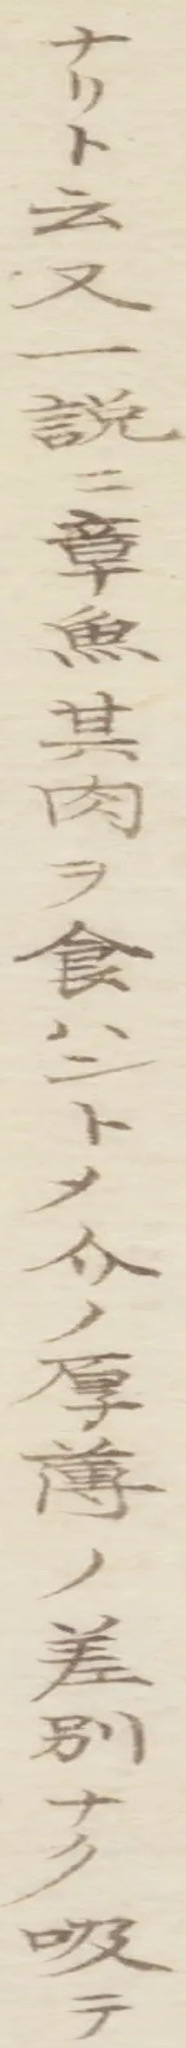ナリトイフ又一説ニ章魚其肉ヲ食ハントシテ介ノ厚薄ノ差別ナク吸テ
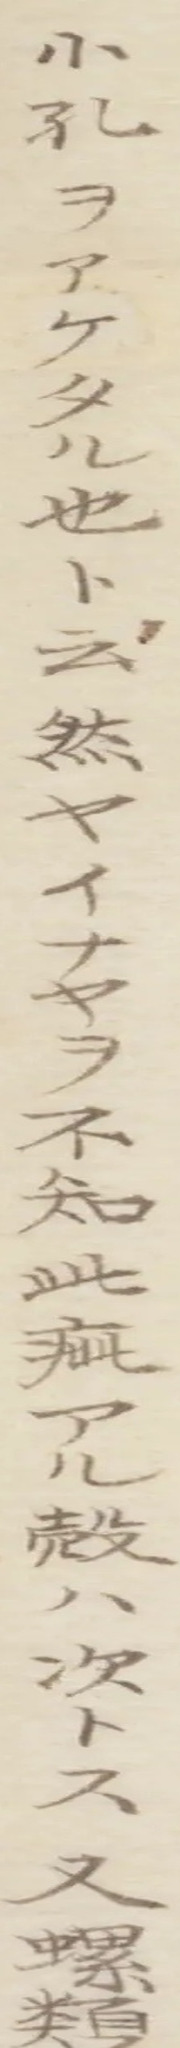小孔ヲアケタル也トイフ然ヤイナヤヲ不知此瑕疵アル殻ハ次トス又螺類
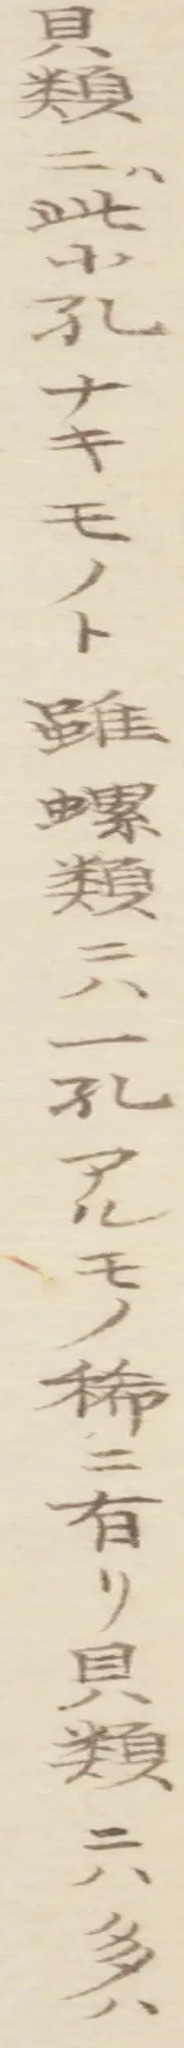貝類ニハ此小孔ナキモノト雖螺類ニハ一孔アルモノ稀ニ有リ貝類ニハ多ハ
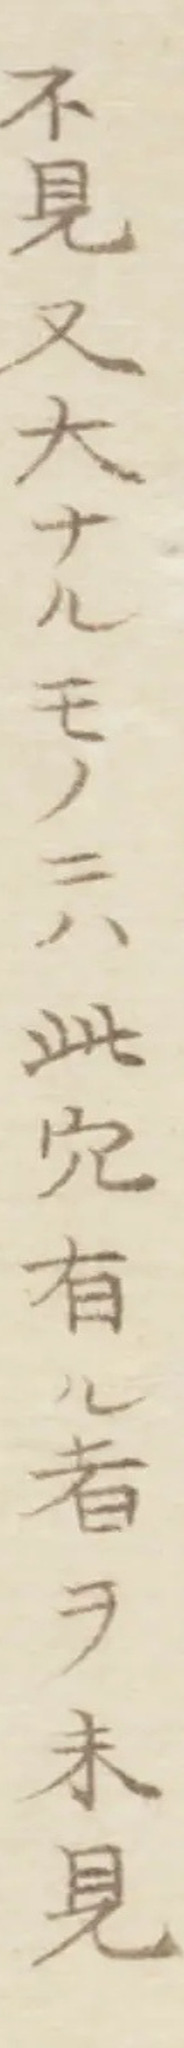不見又大ナルモノニハ此穴有ル者ヲ未見
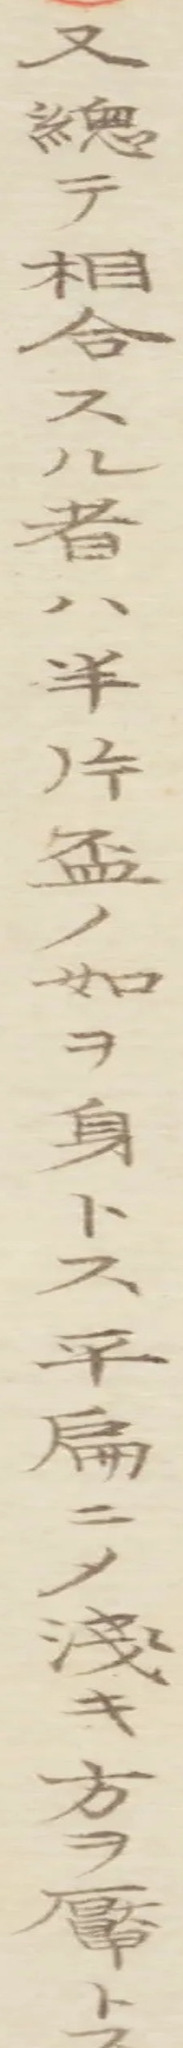○又総テ相合スル者ハ半斤杯ノ如ヲ身トス平扁ニシテ浅キ方ヲ厴トス
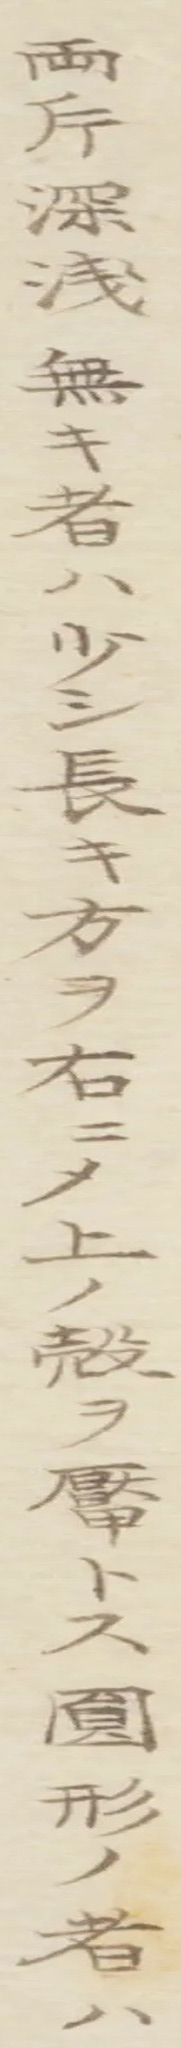両斤深浅無キ者ハ少長キ方ヲ右ニシテ上ノ殻ヲ厴トストス圓形ノ者ハ
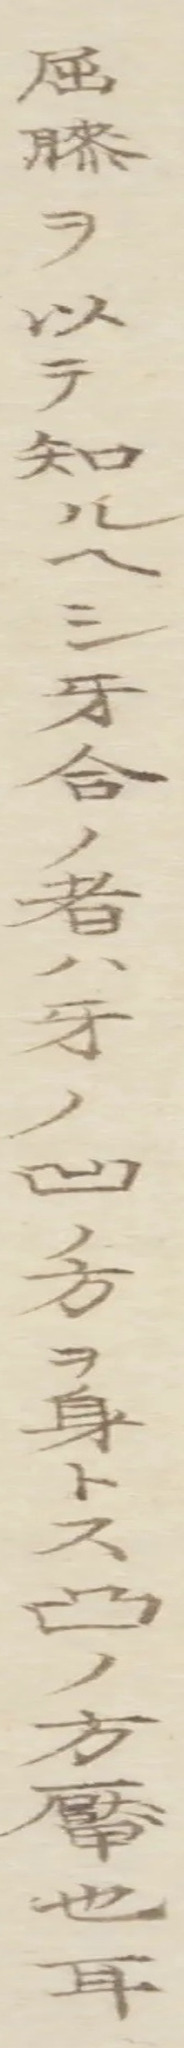屈膝ヲ以テ知ルヘシ牙合ノ者ハ牙ノ凹ノ方ヲ身トス凸ノ方厴也耳
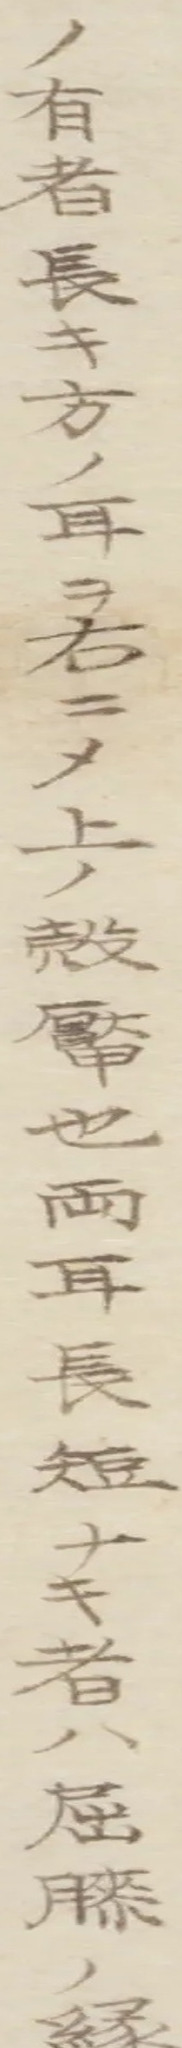ノ有者長キ方ノ耳ヲ右ニシテ上ノ殻厴也両耳長短ナキ者ハ屈膝ノ縁
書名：目八譜. 第１巻
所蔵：国立国会図書館 National Diet Library, JAPAN
